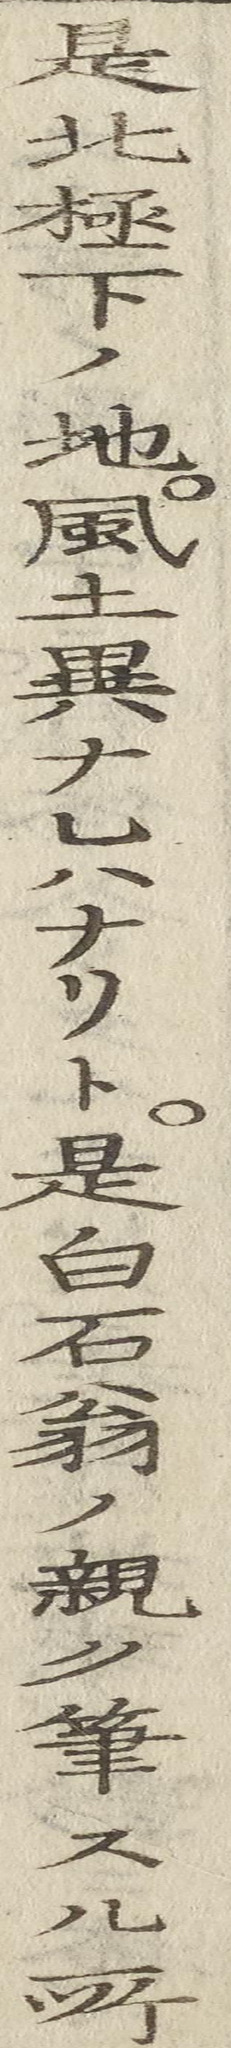是北極下ノ地。風土異ナレハナリト。是白石翁ノ親ク筆スル所
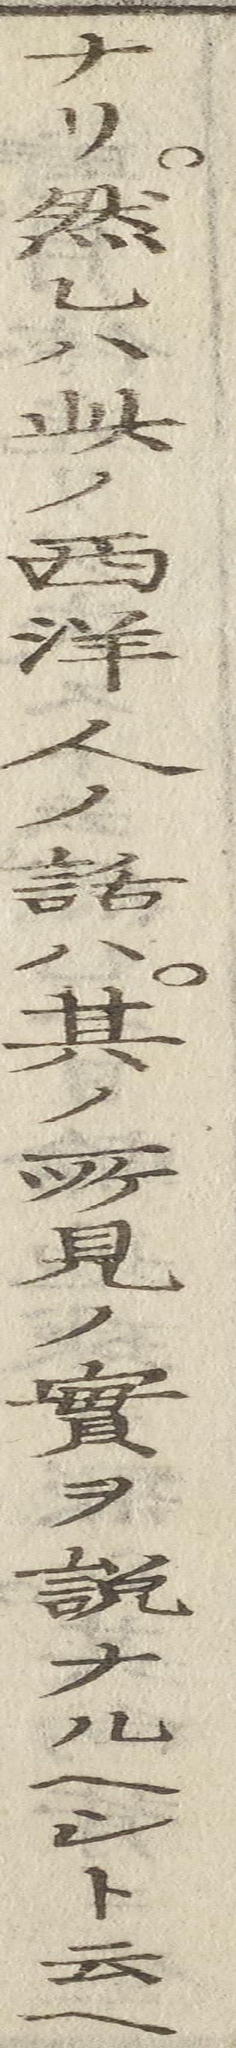ナリ。然レハ此ノ西洋人ノ話ハ。其ノ所見ノ実ヲ説ナルヘシト云ヘ
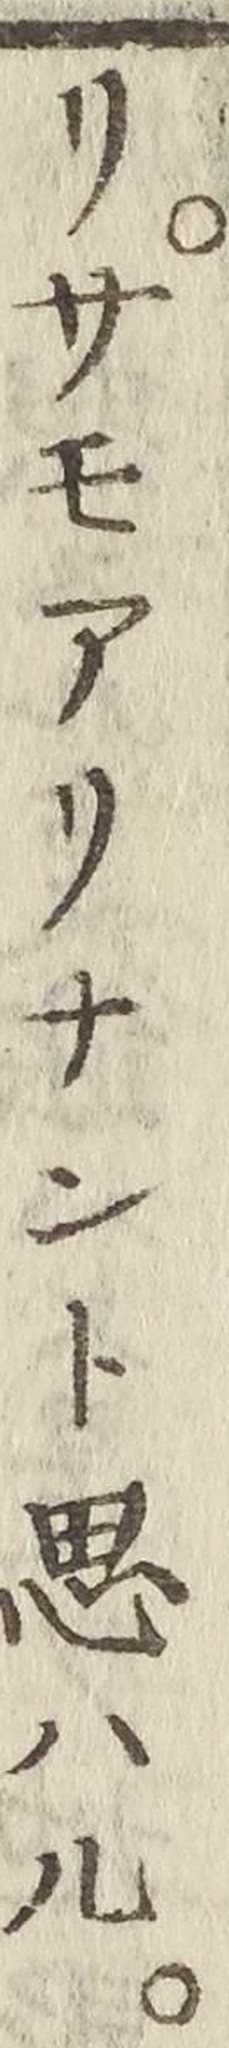リ。サモアリナント思ハル。
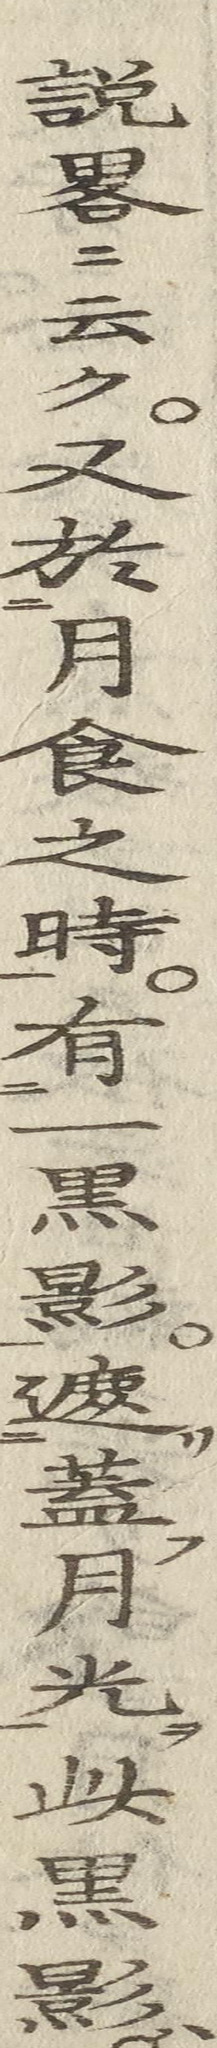説略ニ云ク。又於月食之時。有一黒影。遮蓋月光此黒影。
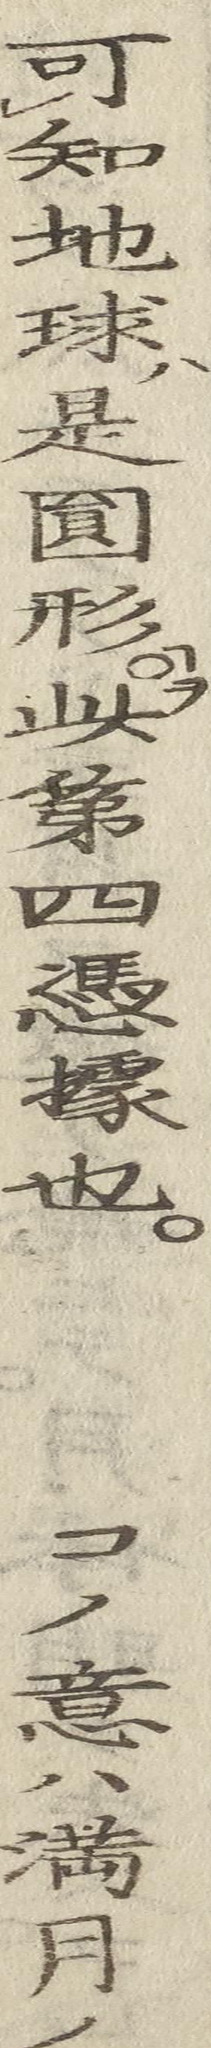可知地球是円形ヿヲ。此第四憑拠也。コノ意ハ満月ノ

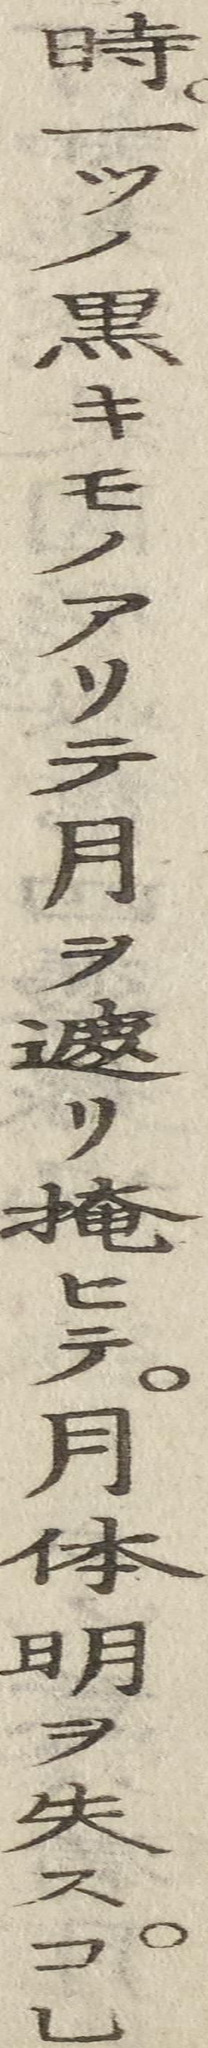時。一ツノ黒キモノアリテ月ヲ遮リ掩ヒテ。月体明ヲ失ス。コレ
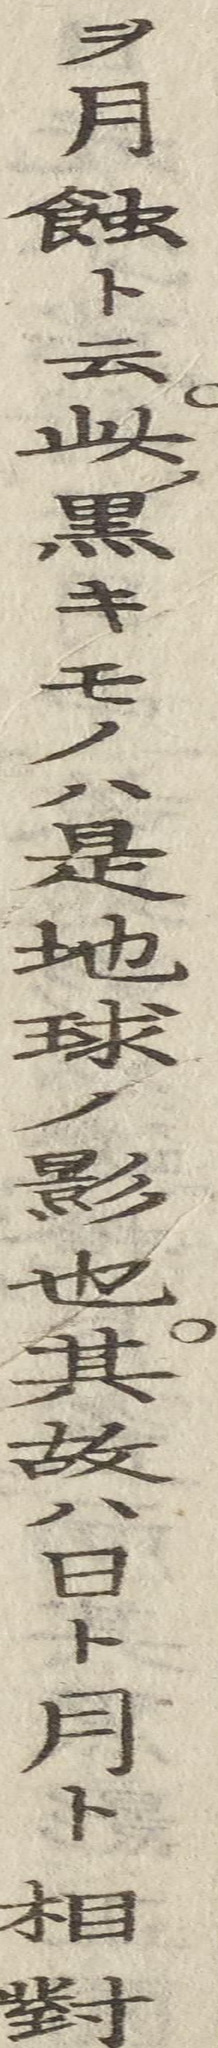ヲ月蝕ト云。此黒キモノハ是地球ノ影也。其故ハ日ト月ト相対
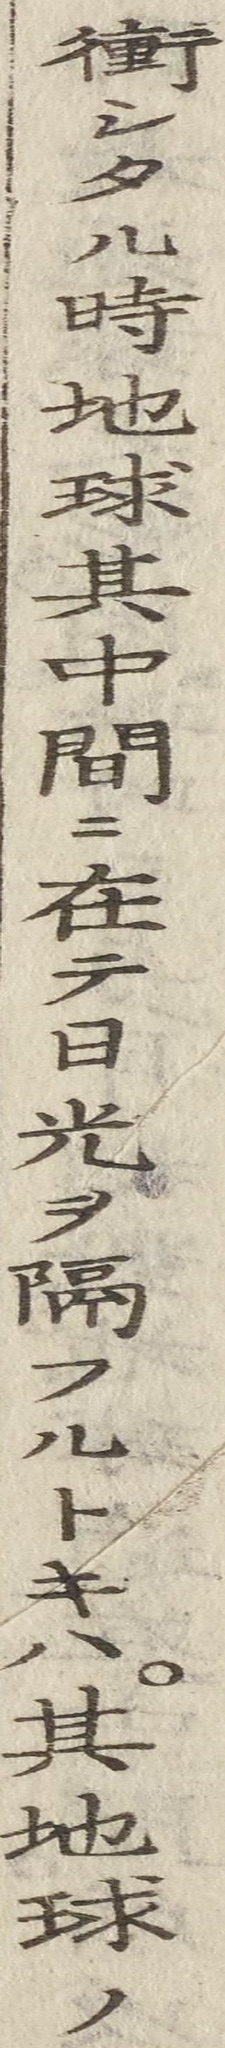衝シタル時地球其中間ニ在テ日光ヲ隔フルトキハ。其地球ノ
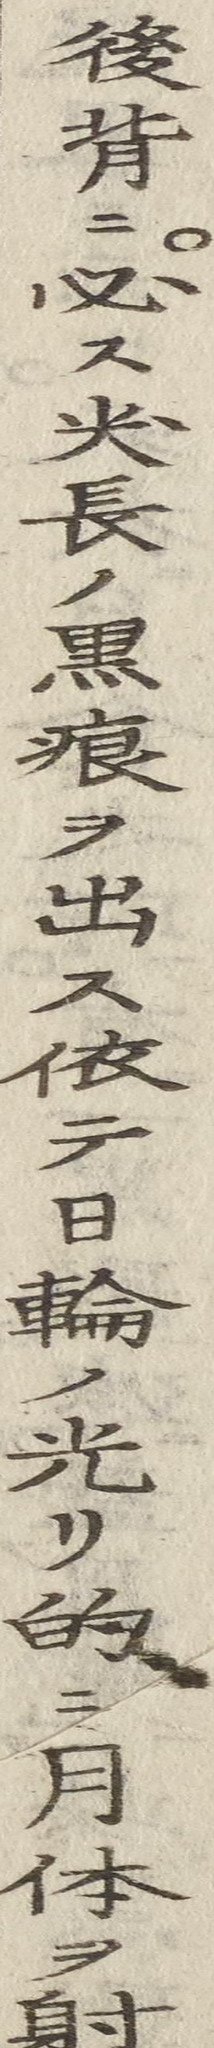後背ニ。必ス尖長ノ黒痕ヲ出ス依テ日輪ノ光リ的ニ月体ヲ射
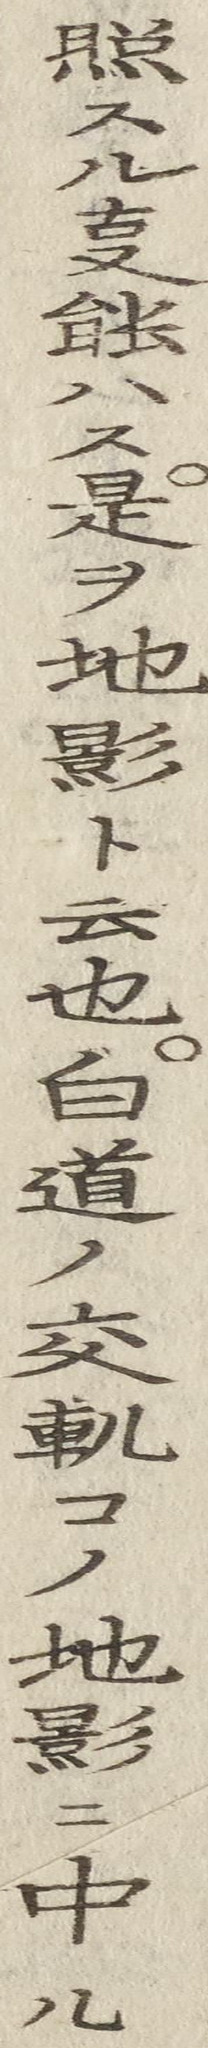脱スル事能ハス。是ヲ地影ト云也。白道ノ交軌コノ地影ニ中ル
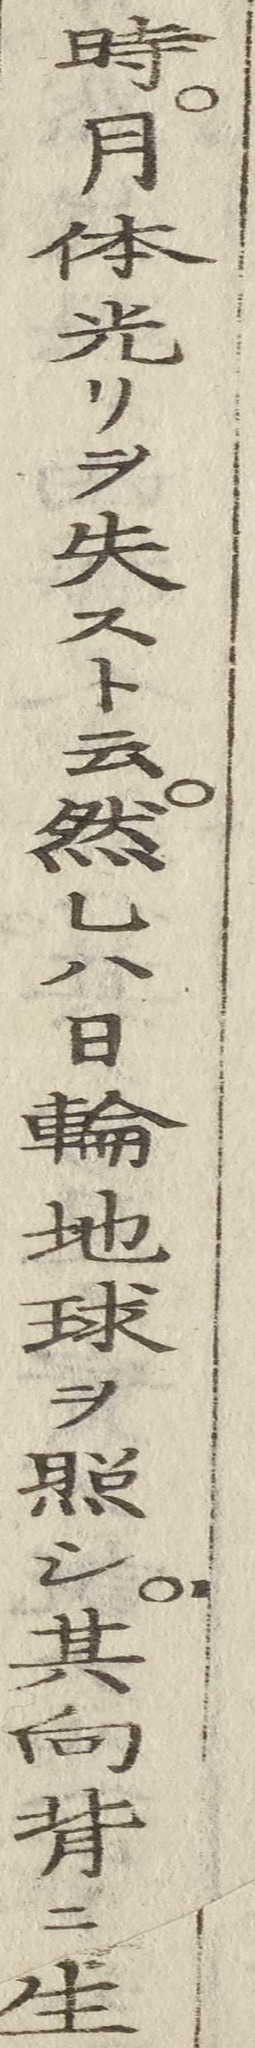時。月体光リヲ失スト云。然レハ日輪地球ヲ照シ。其向背ニ生
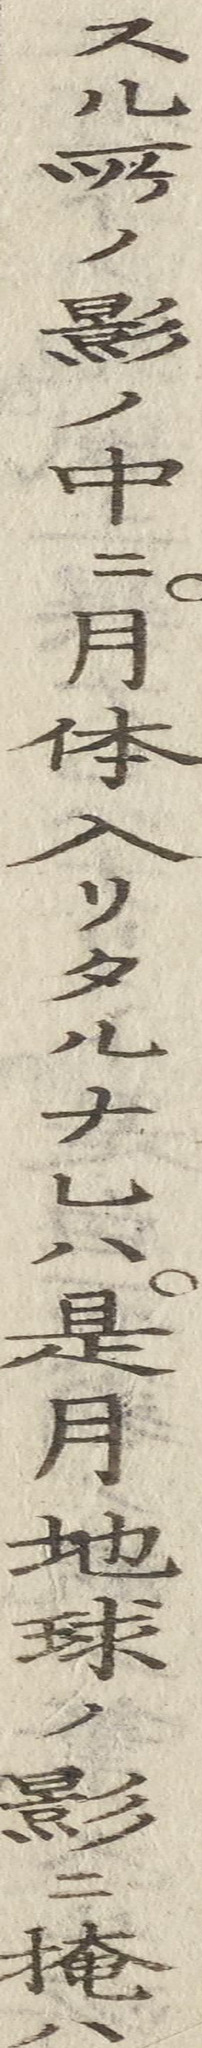スル所ノ影ノ中ニ。月体入リタルナレハ。是月地球ノ影ニ掩ハ
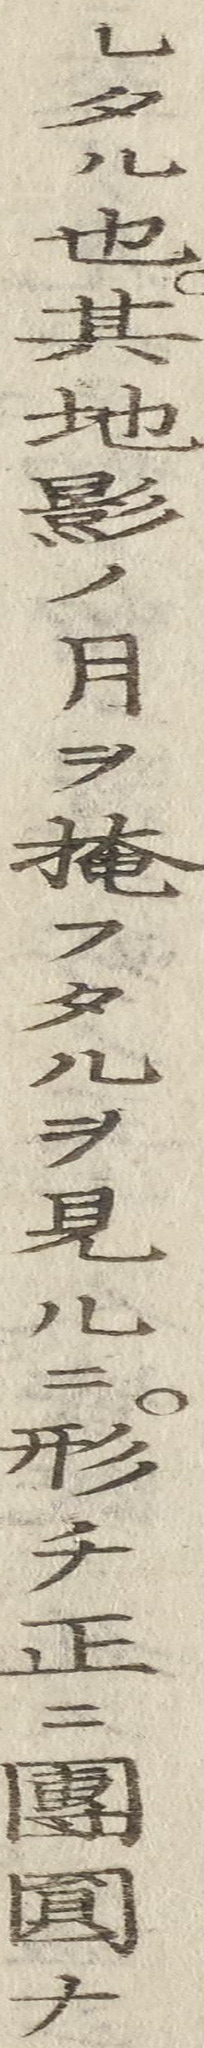レタル也。其地影ノ月ヲ掩フタルヲ見ルニ。形チ正ニ団円ナ
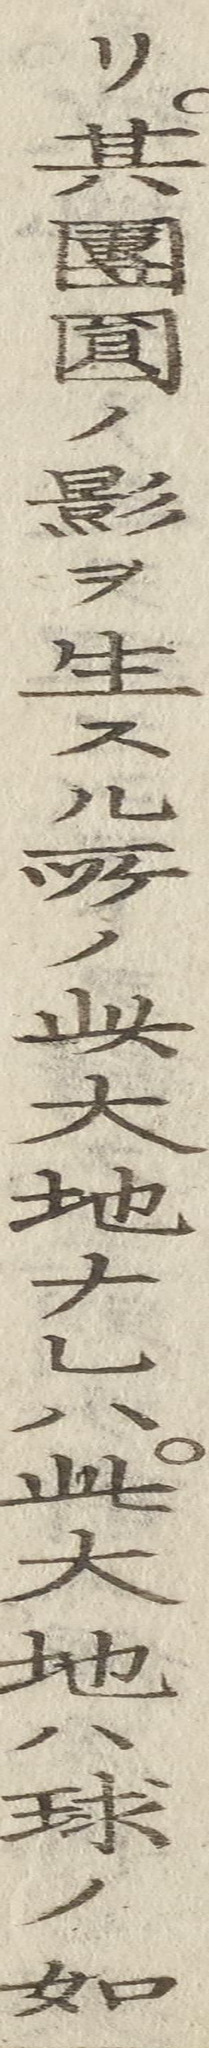リ。其団円ノ影ヲ生スル所ノ此大地ナレハ。此大地ハ球ノ如
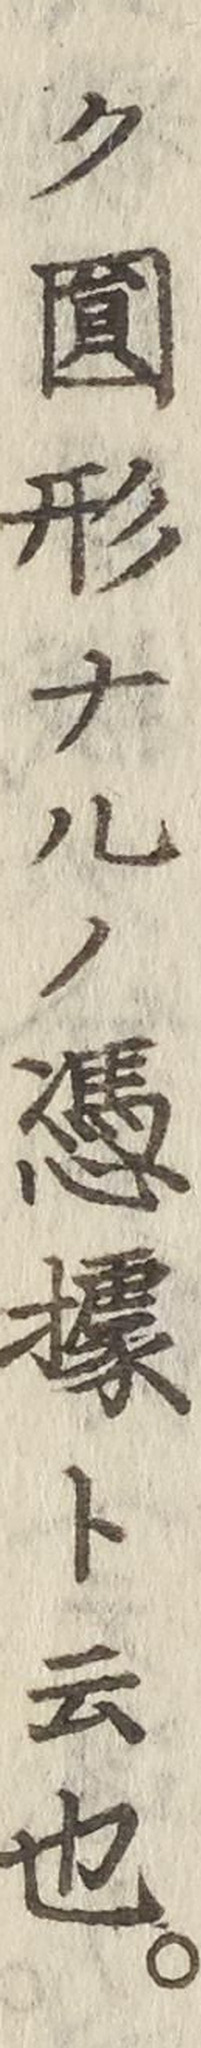ク円形ナルノ憑拠ト云也。
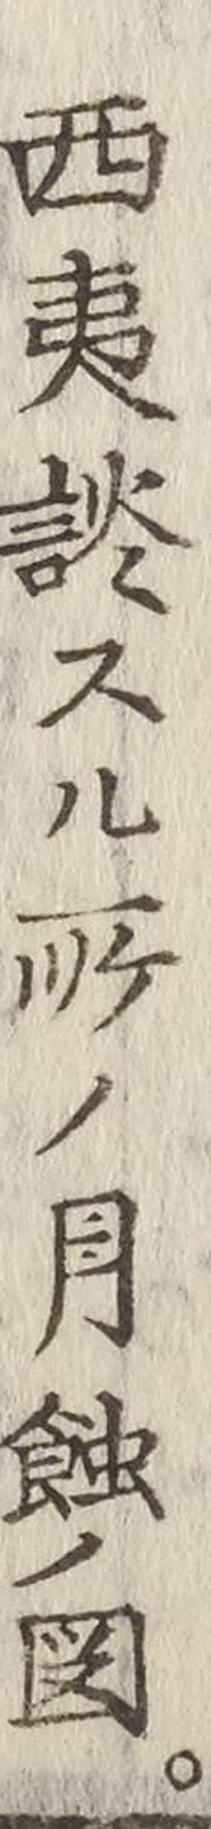西夷談スル所ノ月蝕ノ図。
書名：護法新論　中
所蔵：東京大学地震研究所図書室 Earthquake Research Institute Library, The University of Tokyo, JAPAN
